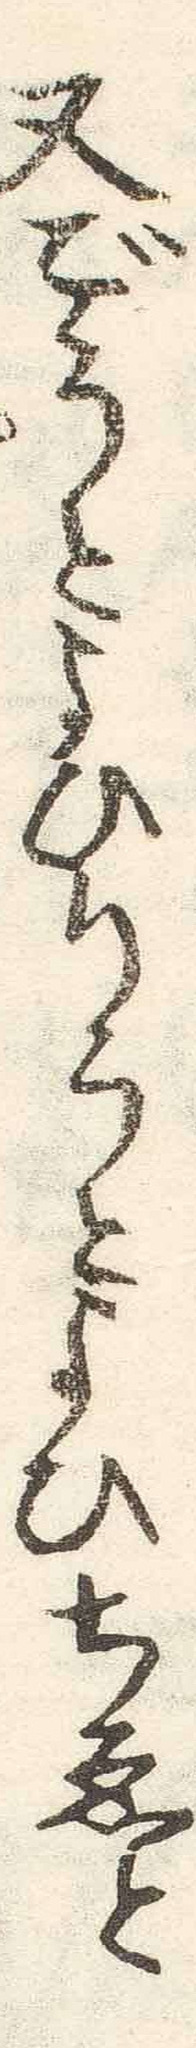又ごうよひりうとよひちゑと
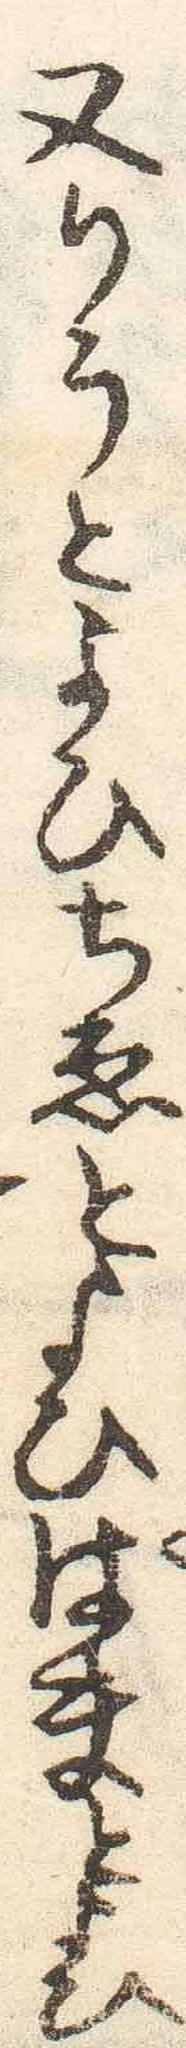又りうとよひちゑとよひぱまとよひ
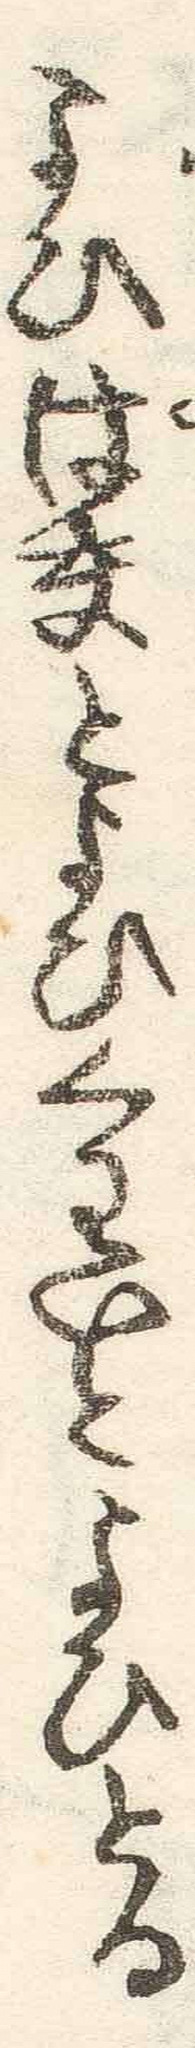よひぱまとよひくわいとよひとる
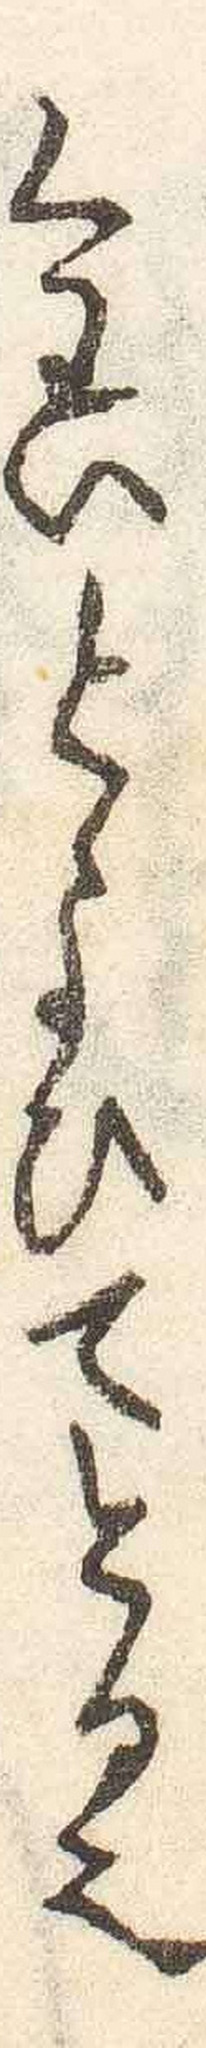くわいとよひてとる也
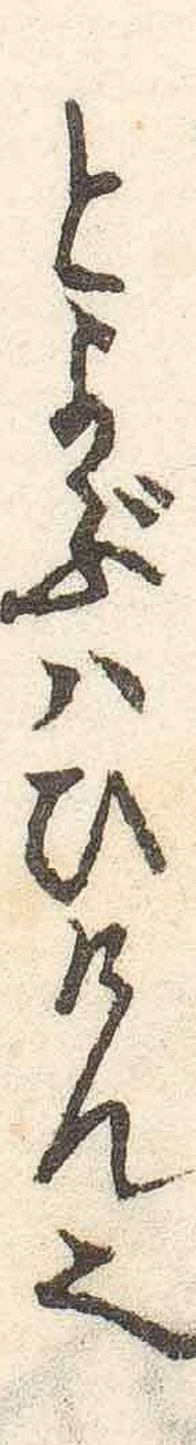とよぶはひけん也
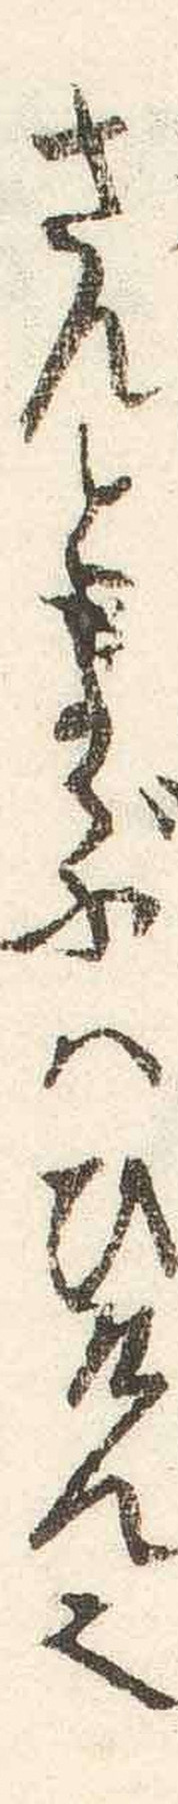さんとよぶはひけん也

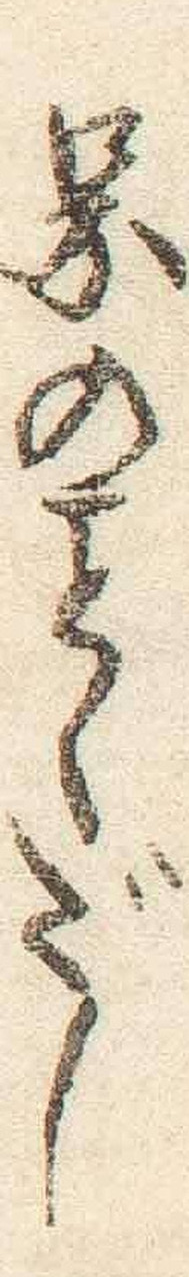図のことくだし
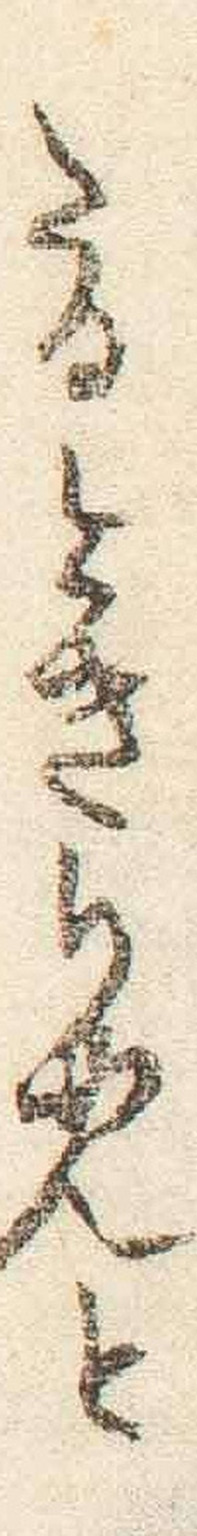たるときりやんと
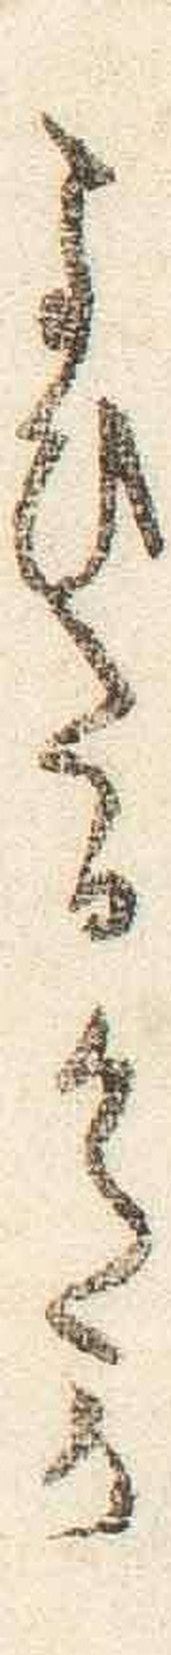よひたるかたか
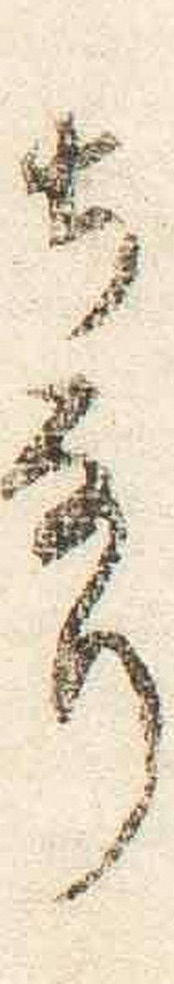ちなり
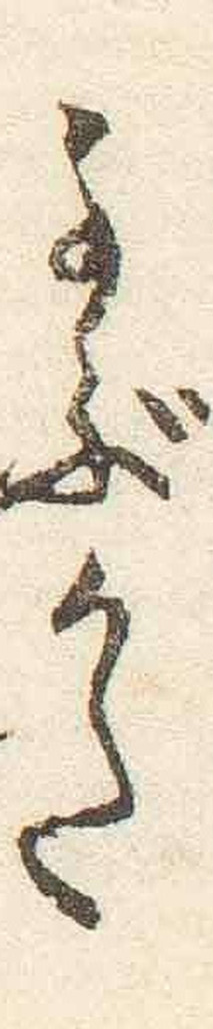よぶかた
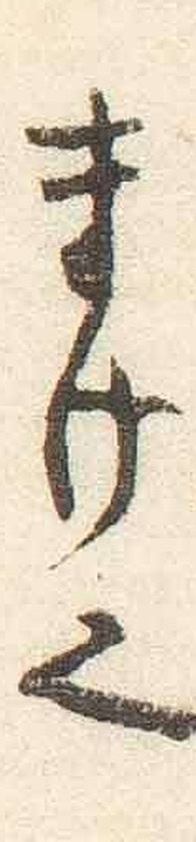まけ也
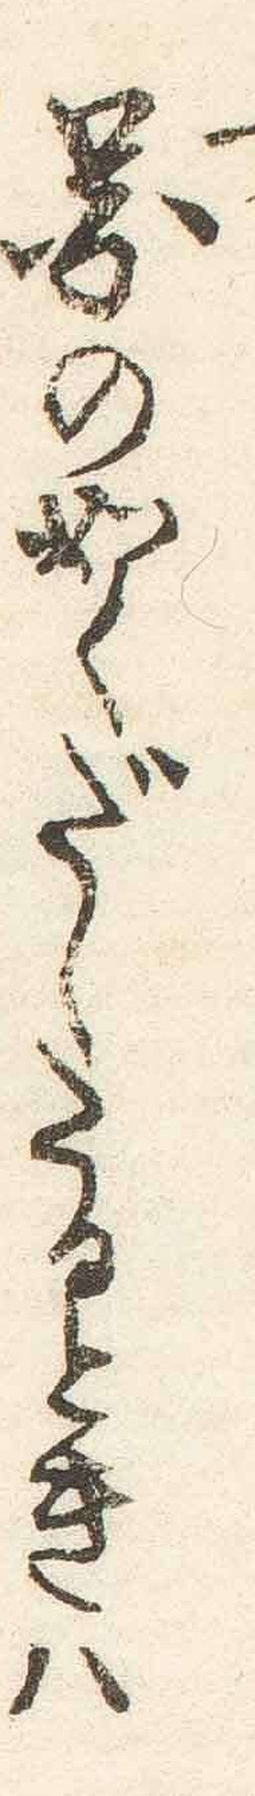図の如くだしたるときは
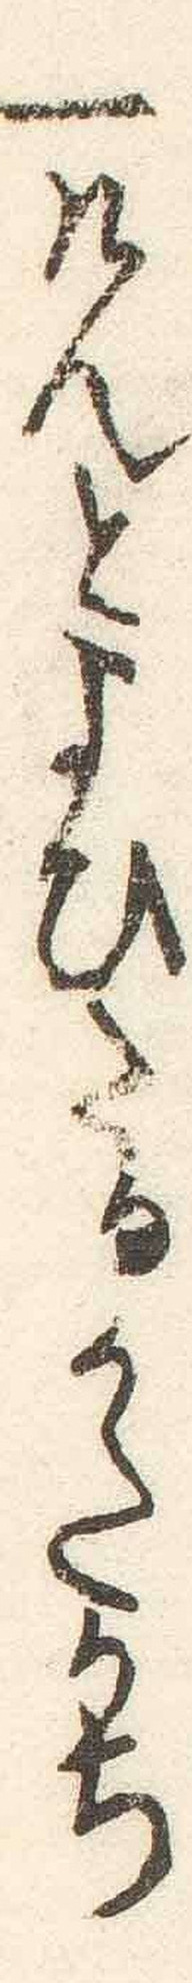一けんとよひたるかたかち
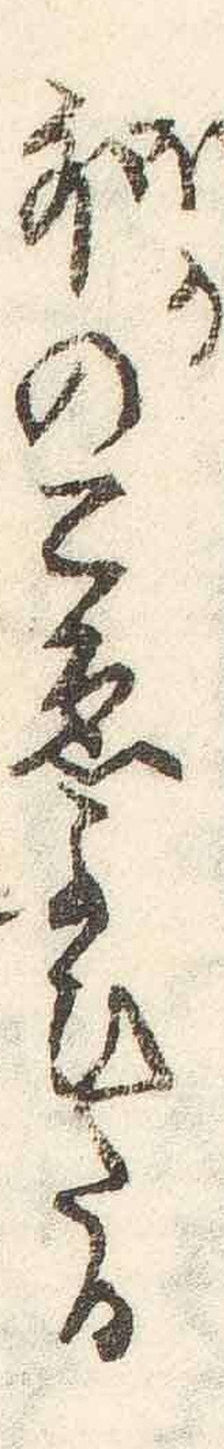外のこゑよひたる
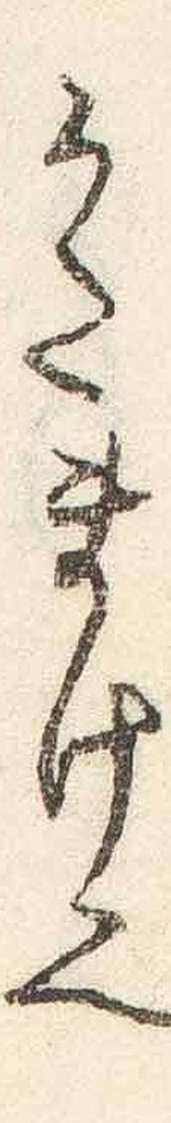かたまけ也
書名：拳独稽古
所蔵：東京学芸大学附属図書館 国文学研究資料館
